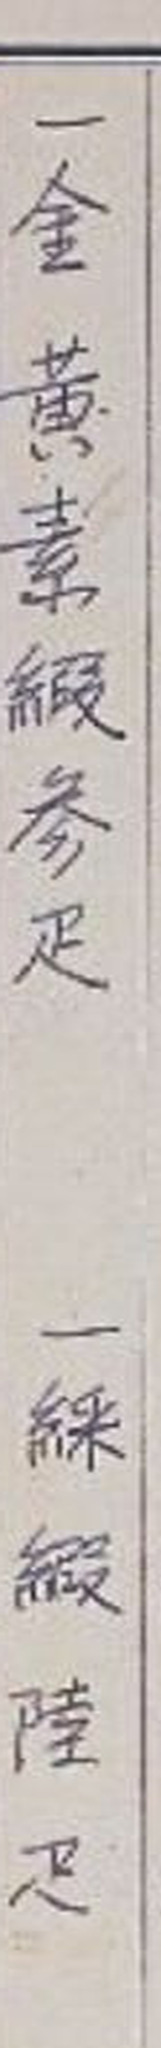一金黄素緞参疋一綵緞陸疋
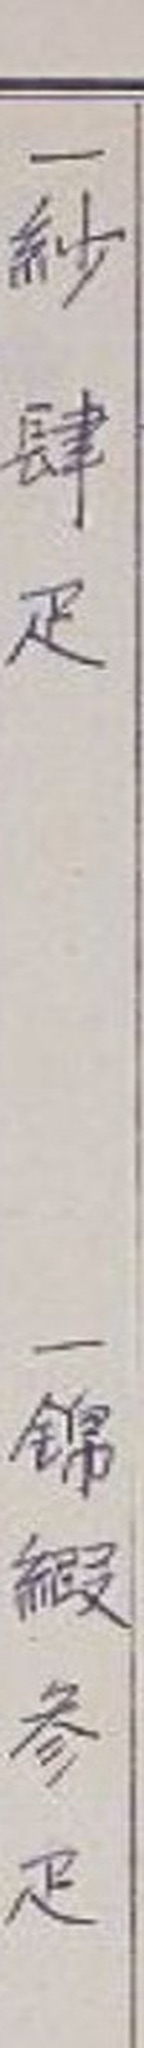一紗肆疋一錦緞参疋
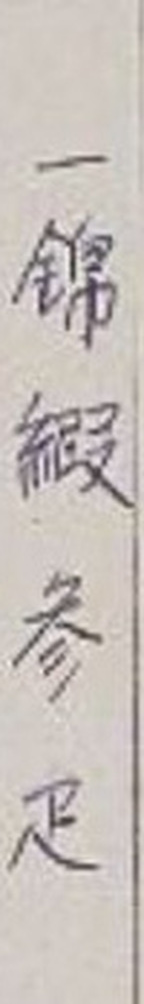一蟒緞弐疋
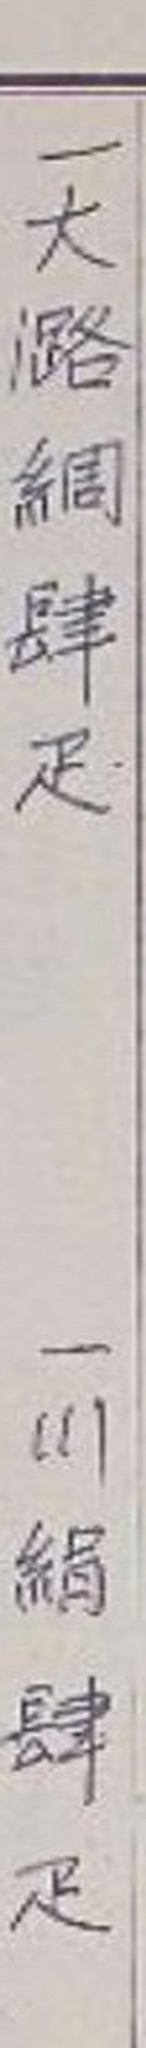一大潞綢肆疋一川絹肆疋
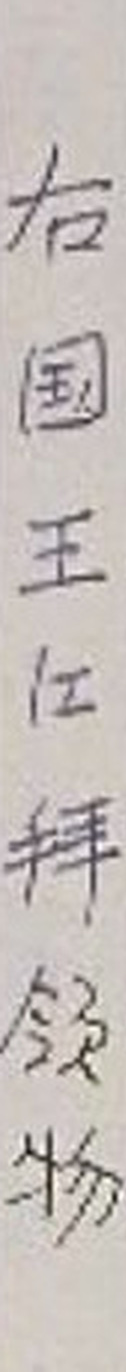右国王え拝領物
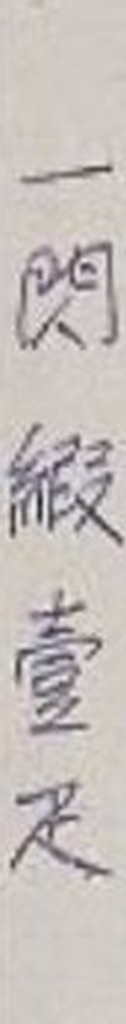一粧緞壱疋一閃緞壱疋
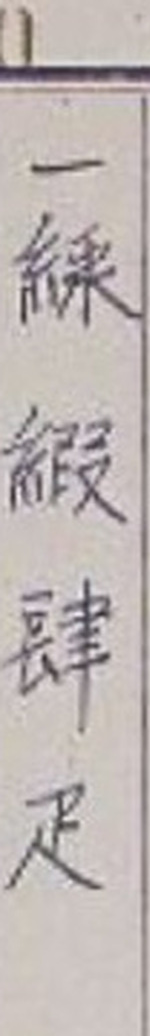一蟒緞弐疋
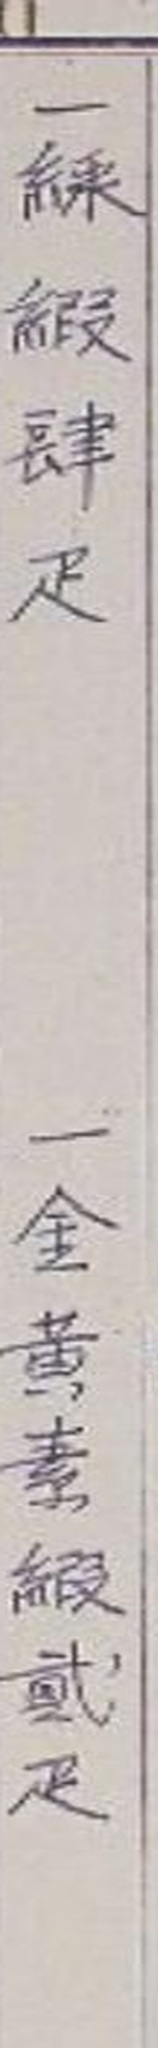一綵緞肆疋一金黄素緞弐疋
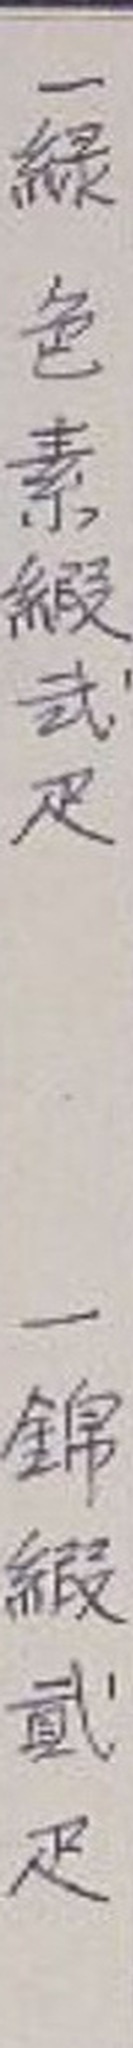一緑色素緞弐疋一錦緞弐疋
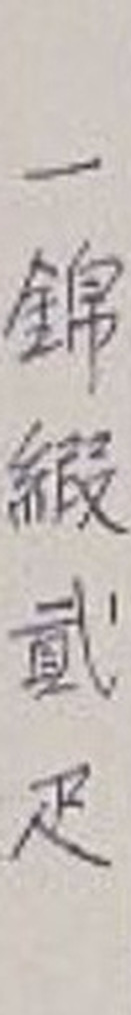一蟒緞弐疋
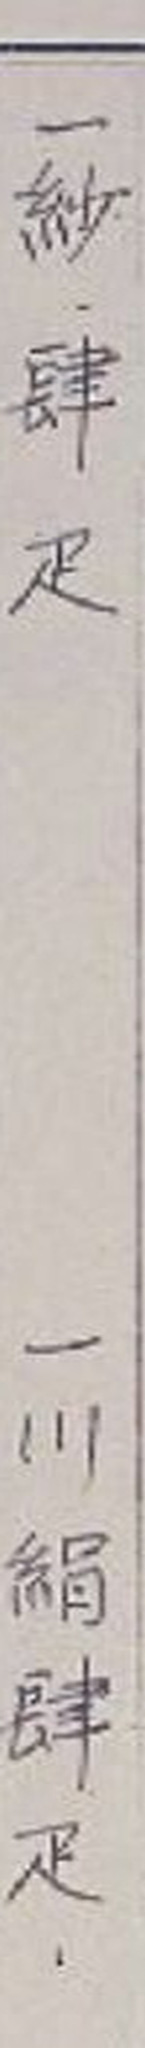一紗肆疋一川絹肆疋
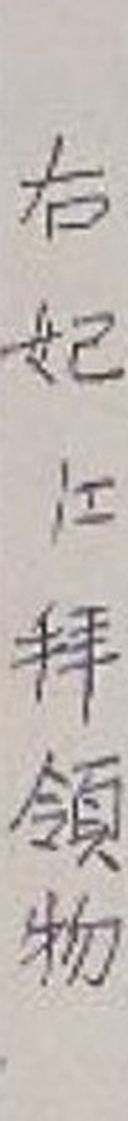右妃え拝領物

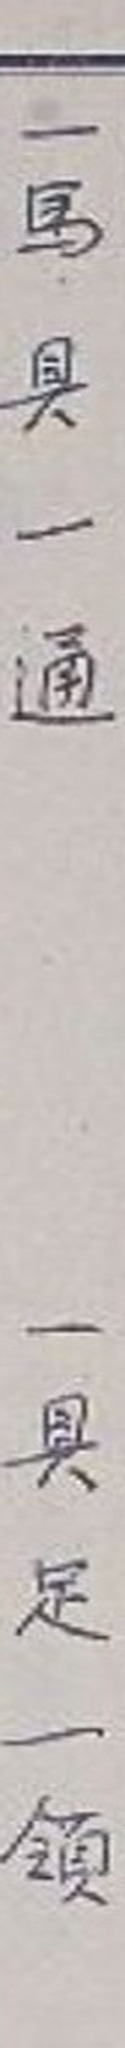一馬具一通一具足一領
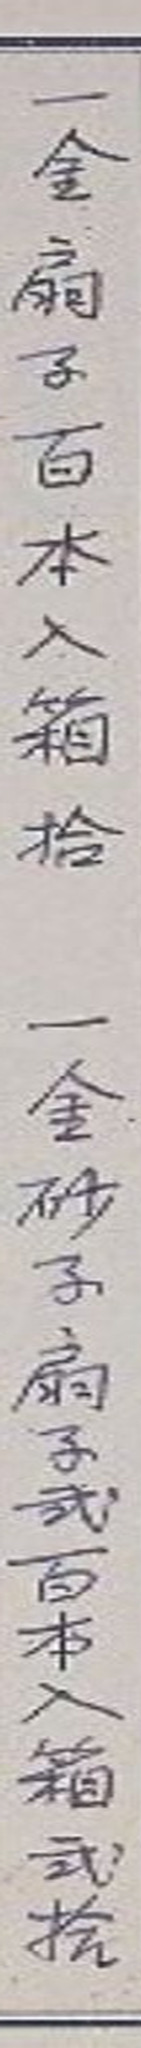一金扇子百本入箱拾一金砂子扇子弐百本入箱弐拾
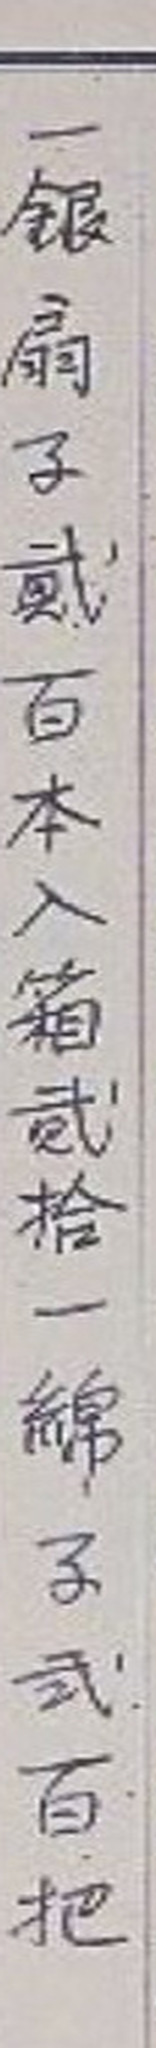一銀扇子弐百本入箱弐拾一綿子弐百把
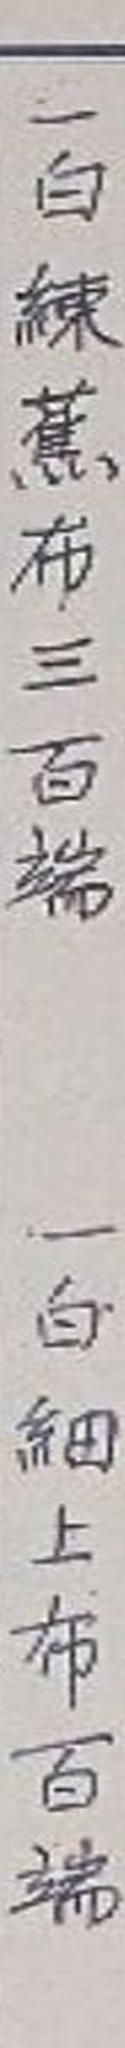一白練蕉布三百端一白細上布百端
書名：支那冊封使来琉諸記 下巻
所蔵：University of the Ryukyus Library
